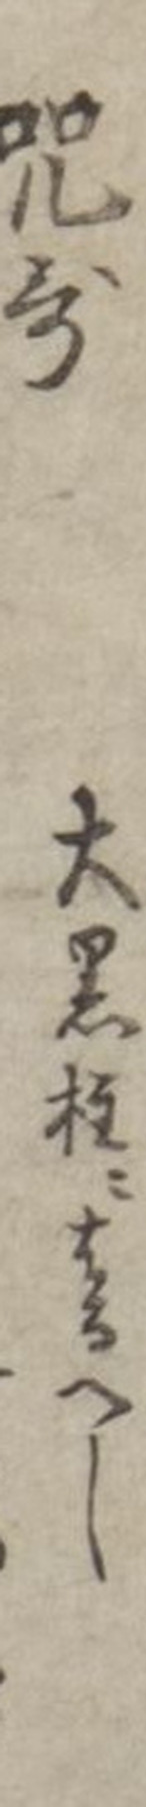咒哥大黒柱にはるへし
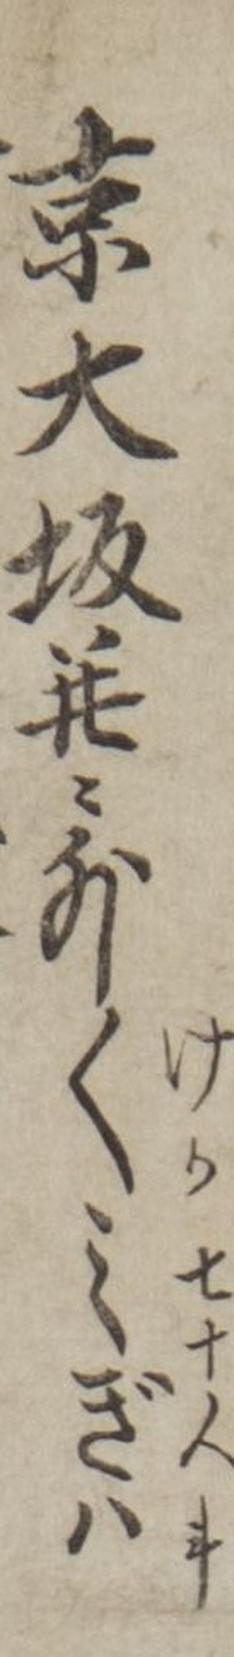京大坂并に外〳〵之ぎは
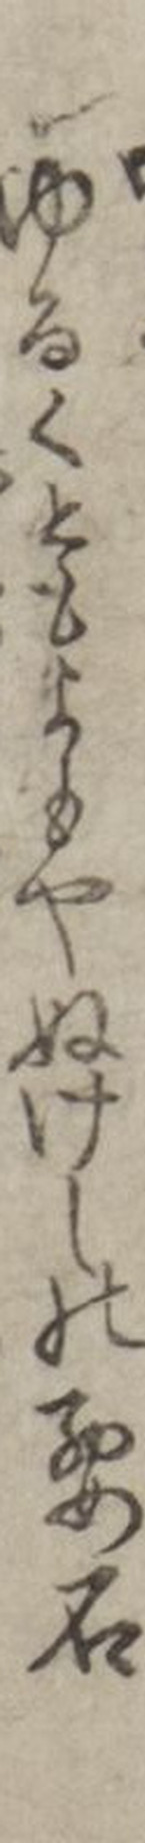ゆるくともよもやぬけしの要石
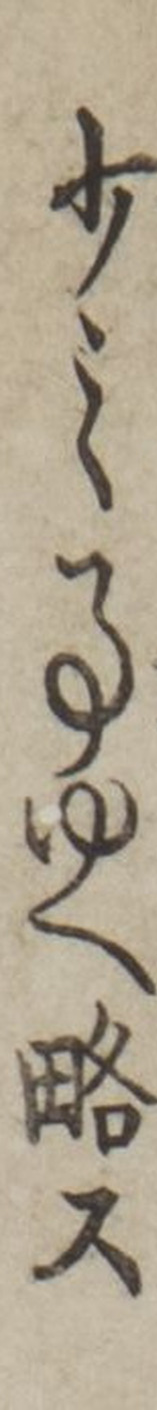少々之事ゆへ略す
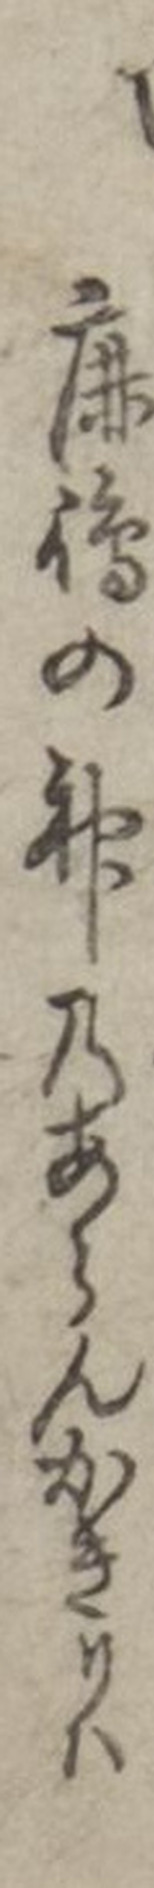鹿嶋の神のあらんかきりは
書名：嘉永七寅年大地震記
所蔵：あいおいニッセイ同和損保株式会社
